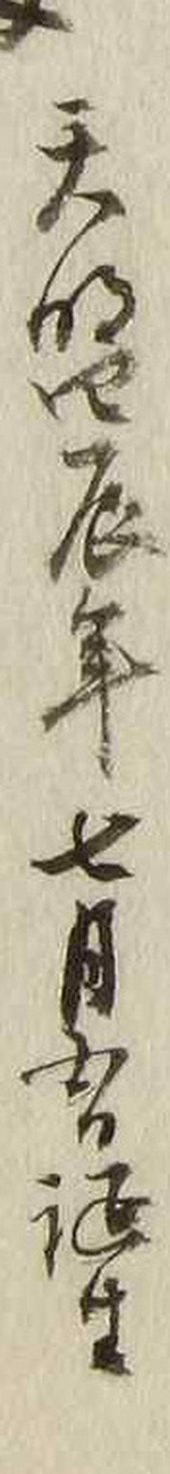天明四辰年七月五日誕生
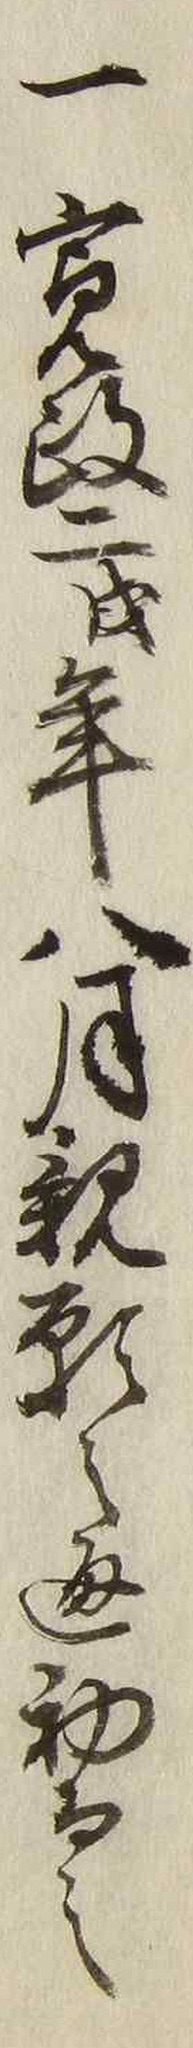一寛政二戌年八月親願之通初而之
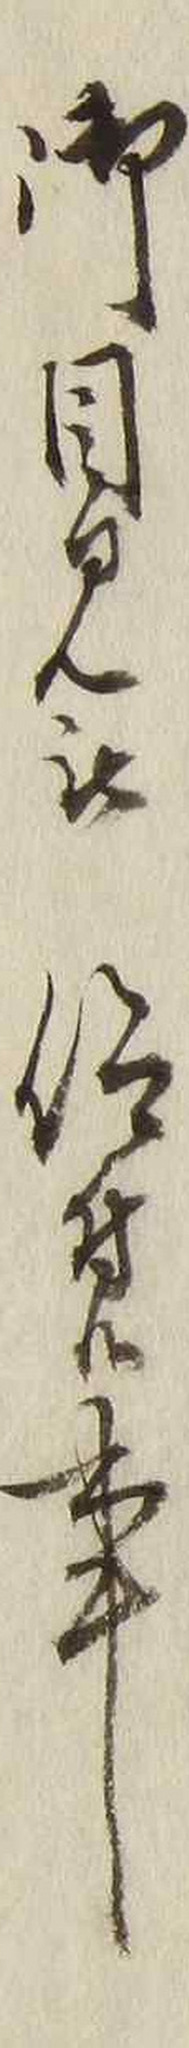御目見被仰付候事

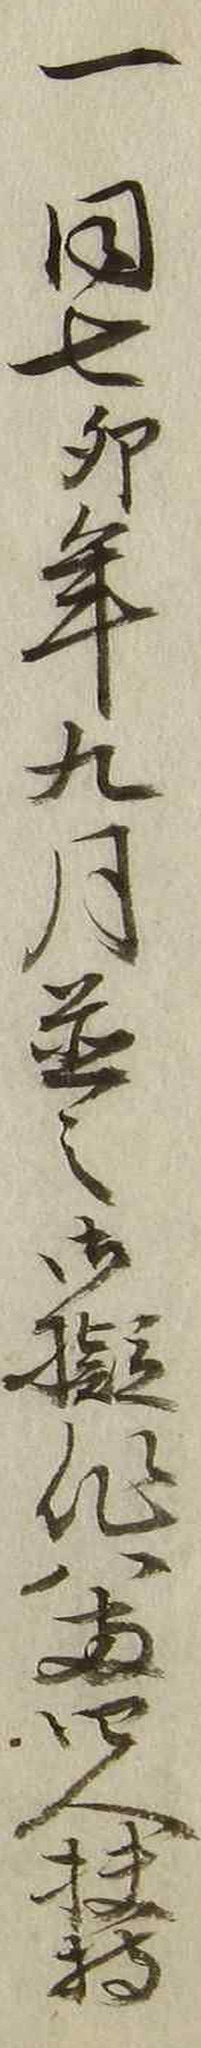一同七卯年九月並之御擬作八両四人扶持
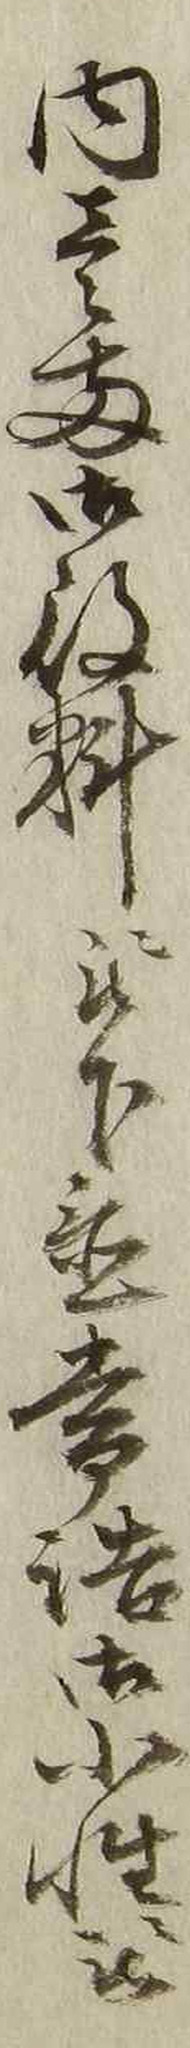内壱両御役料ニ被下置常詰御小性ニ被
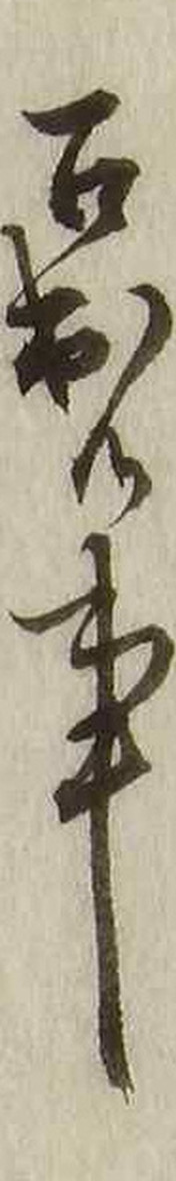召出候事
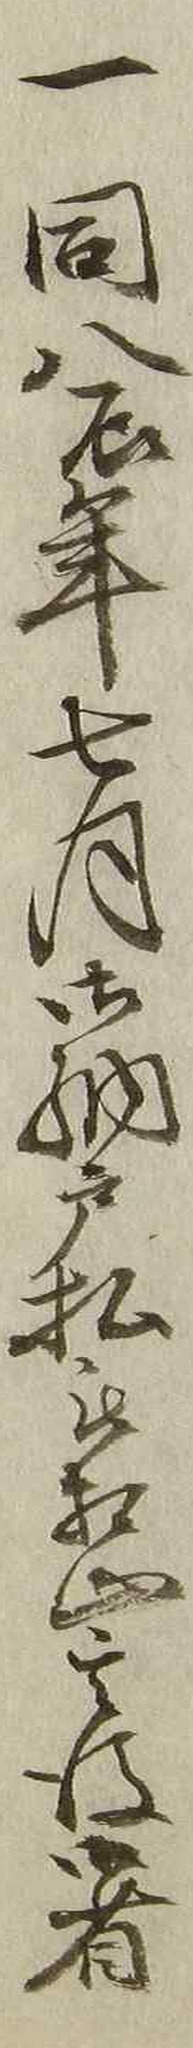一同八辰年七月御納戸払被相止其後御省
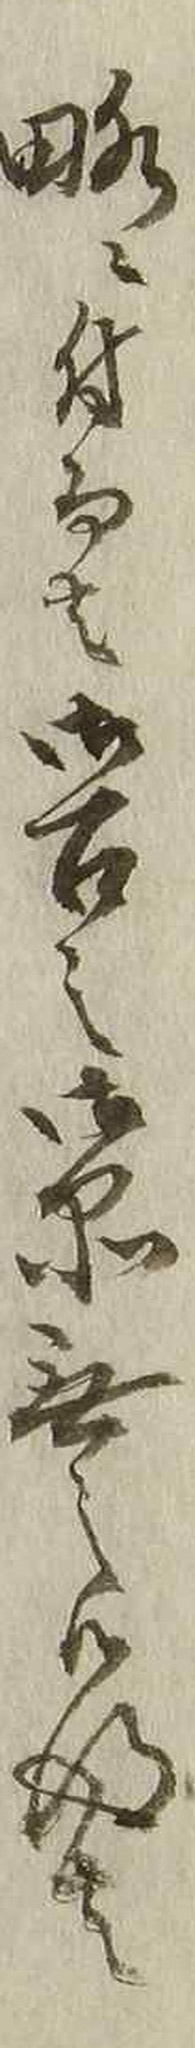略ニ付而者御召之御品無之候得者
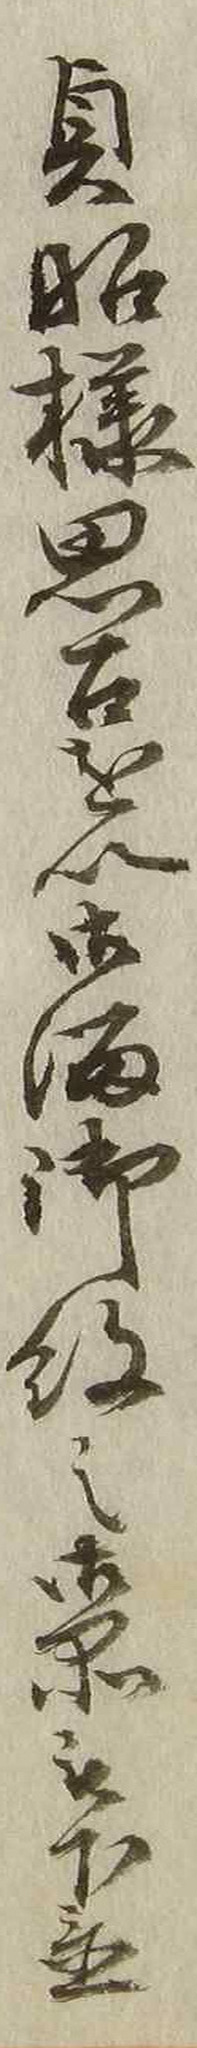貞昭様思召を以御溜御紋之御品被下置
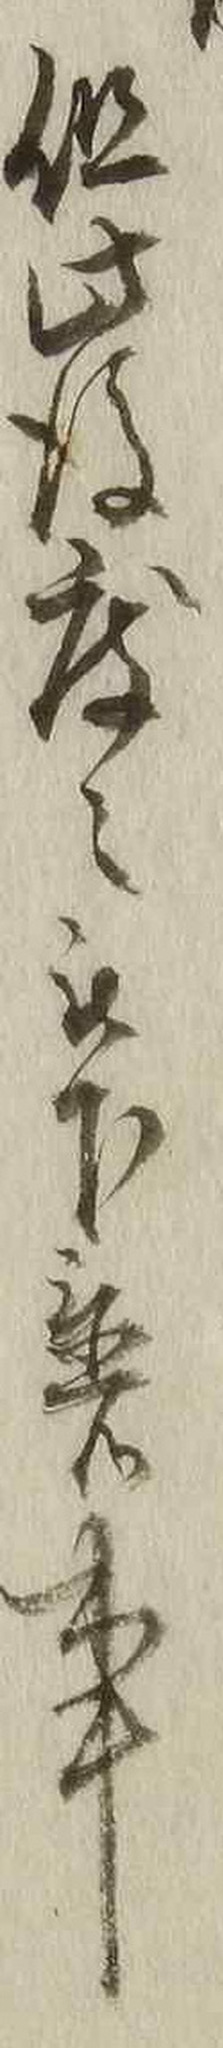但此後度々被下置候事
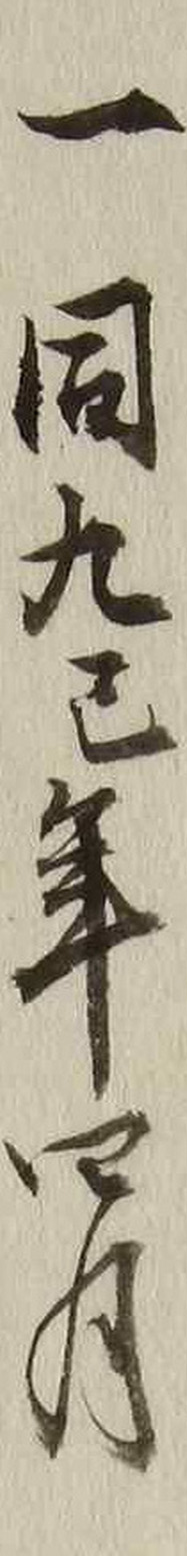一同九巳年四月
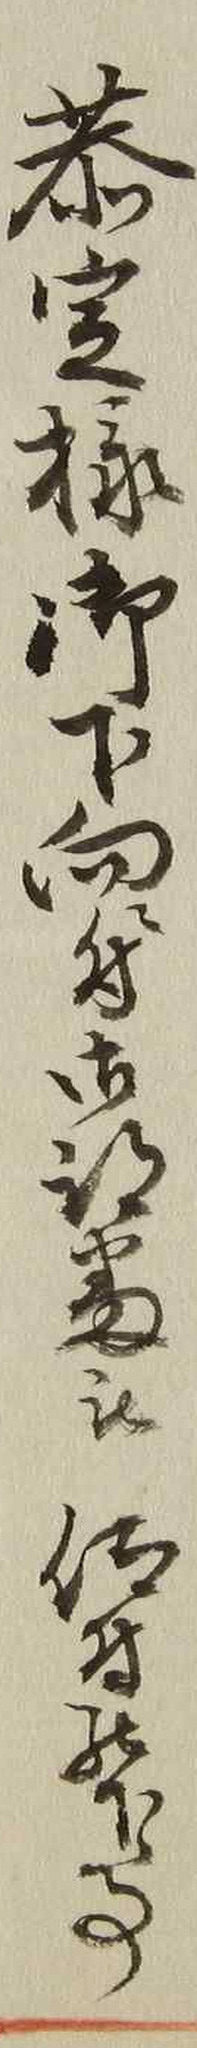恭定様御下向ニ付御跡番被仰付候事
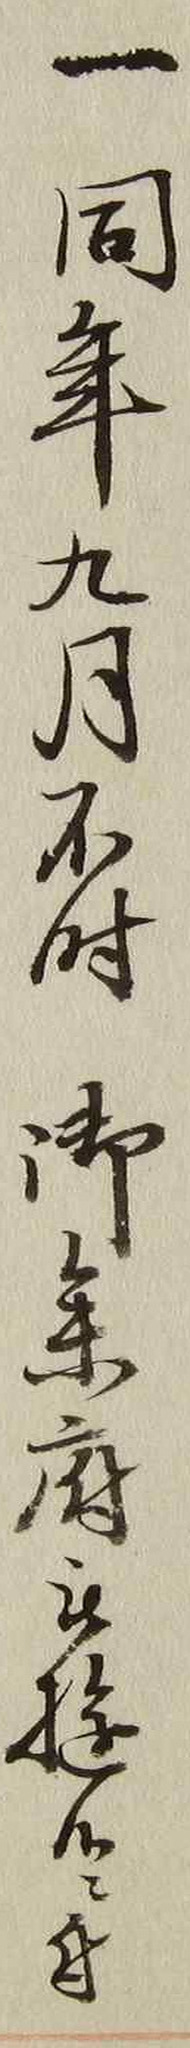一同年九月不時御参府被遊候ニ付
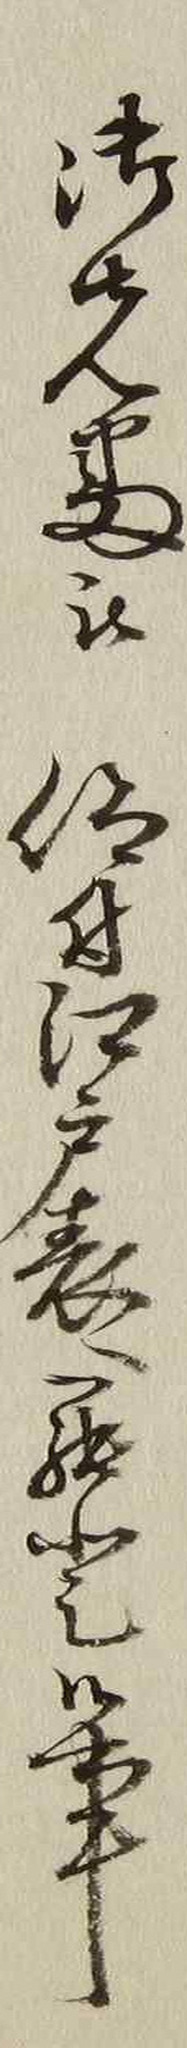御先番被仰付江戸表へ罷登候事
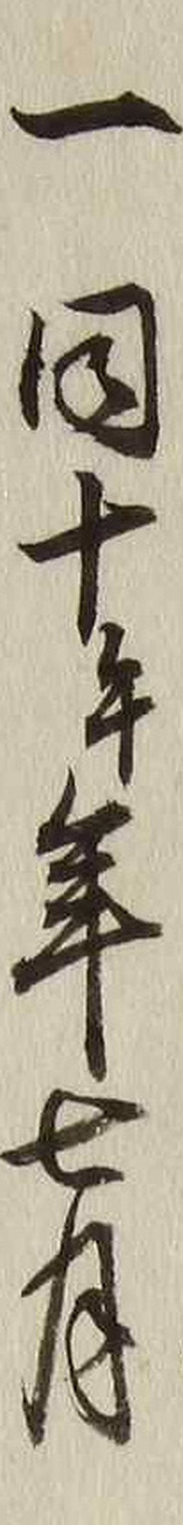一同十午年七月
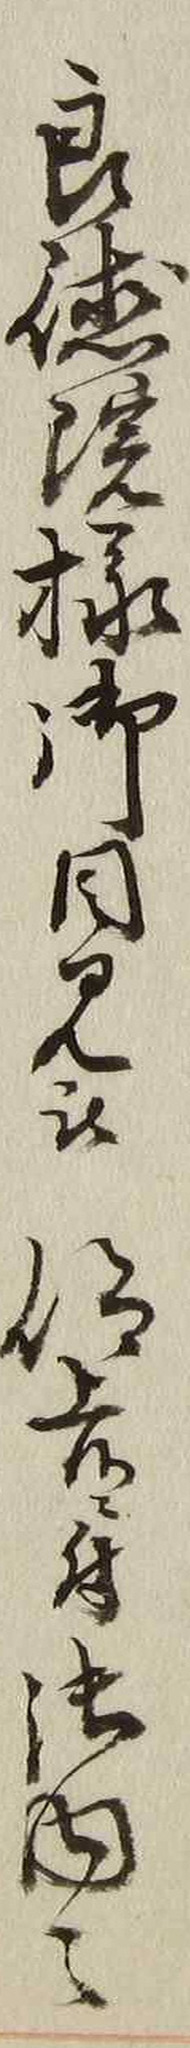良徳院様御目見被仰付候ニ付御内々
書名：諸士系譜　巻之23　い之部23
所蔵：会津若松市立会津図書館
